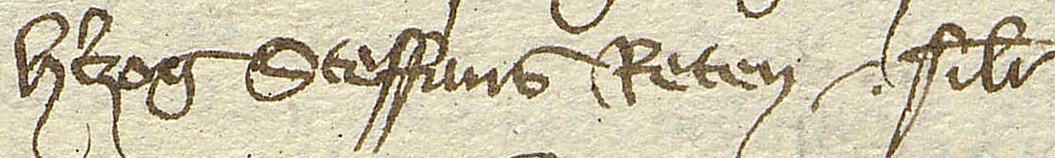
h*cʒog Steffans Reten / . ſilr*
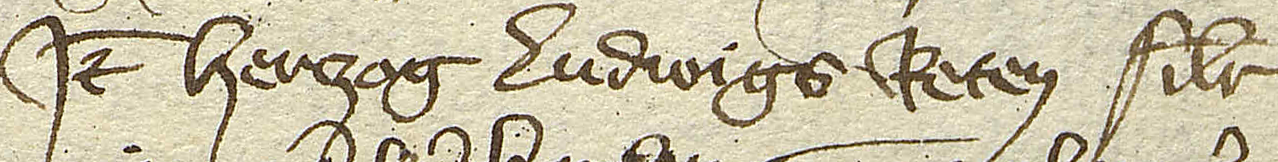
It* hercʒog Ludwigs Reten ſilr*
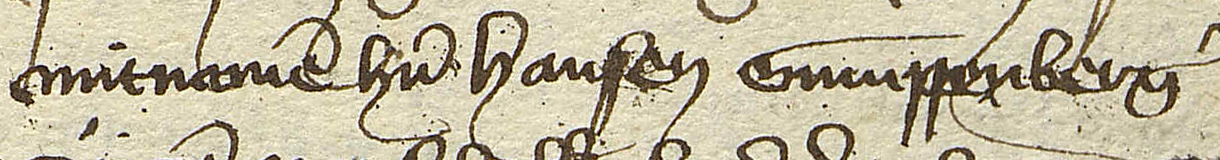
mitname* hn* Hanſen Gumppenberg*
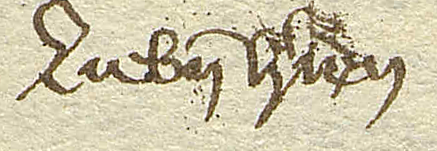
Liebn* h*ren
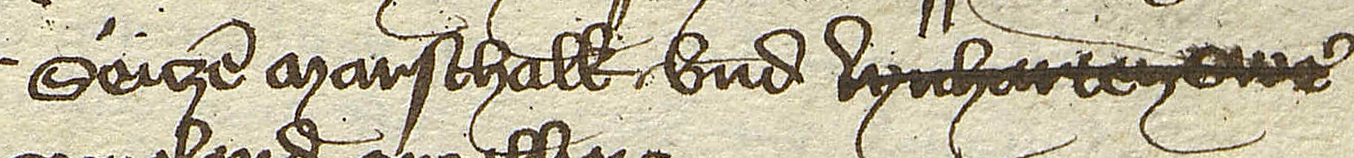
Seicʒe* Marſchalk / vnd lynharten Swe*
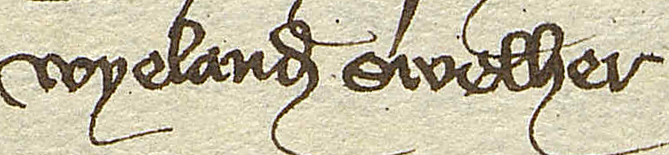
wyeland* Swelher
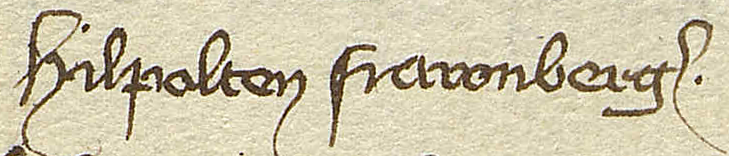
Hilpolten frawenberg* .
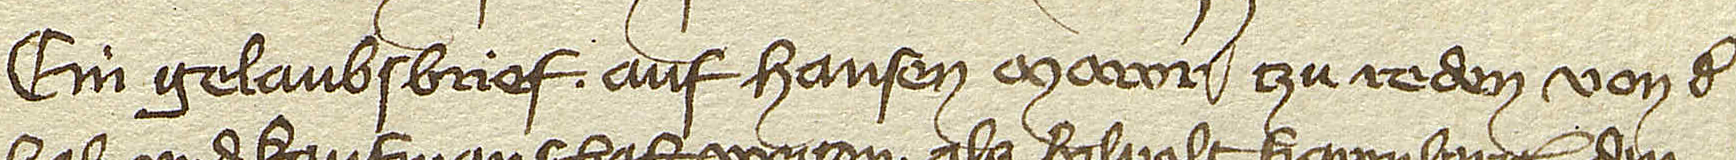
Ein gelaubſbrief . auf hanſen Mawr* cʒu reden von d*
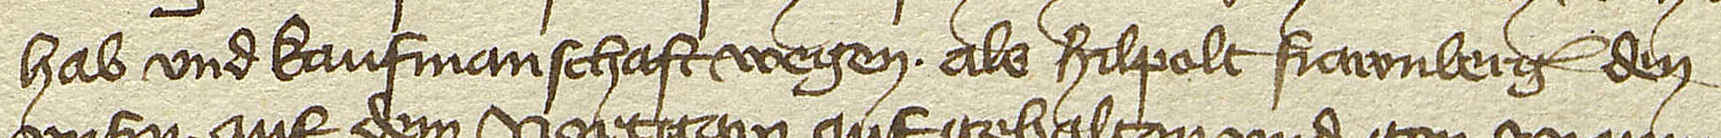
hab vnd kaufmanſchaft wegen . als hilpolt frawnberg* den
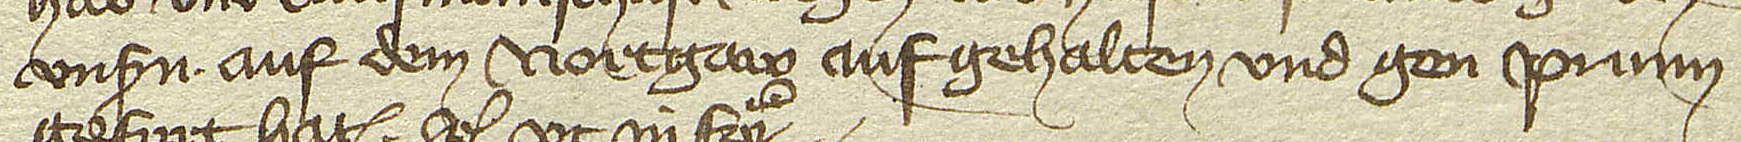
vnſ*n auf dem Nortgaw aufgehalten vnd gen Prunn
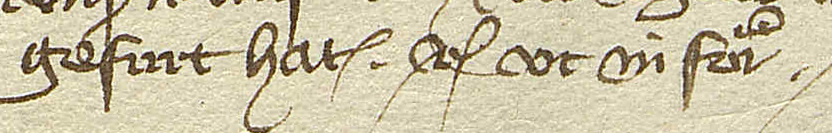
gefurt hat* . ec* vt in for* . /
